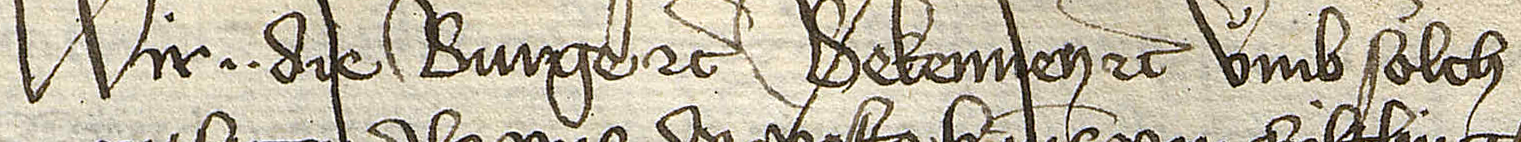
Wir ~ die Burge* ec* Bekennen ec* mb ſölich
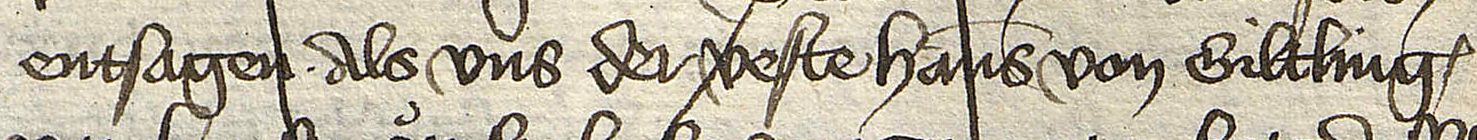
entſagen . Als vns der veſte han*s von Giltling*
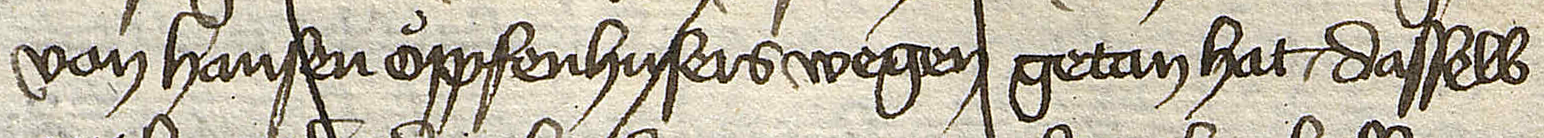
von hanſen Öppgenhufers wegen getan hat / Daſſelb
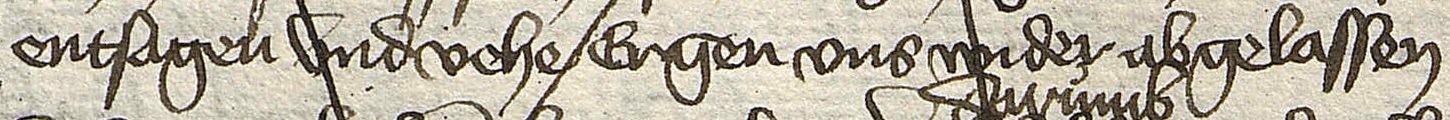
entſagen vnd vehe Er gen vns wider angelaſſen
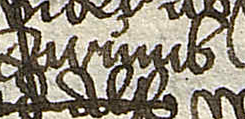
Darümb
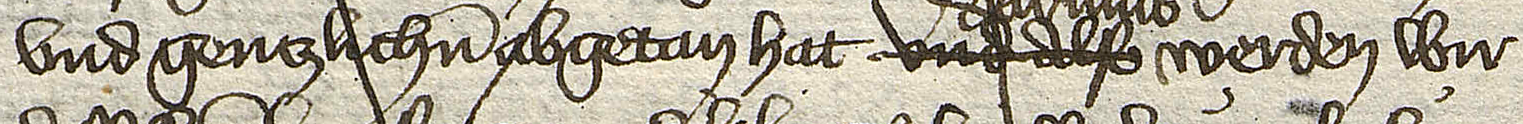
vnd gencʒlichn* abgetan hat . Vnd alſo werden wir
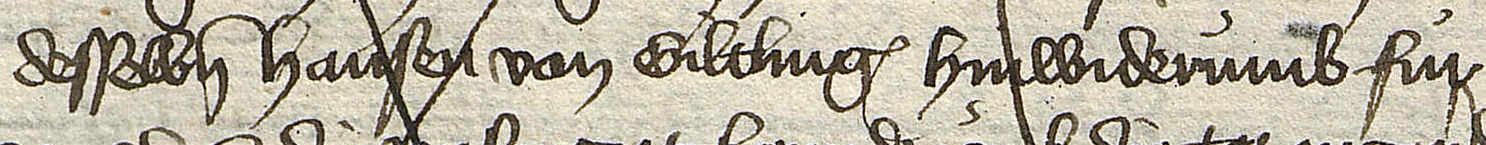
deſſelbn* hanſen von Giltling* hinwiderümb für
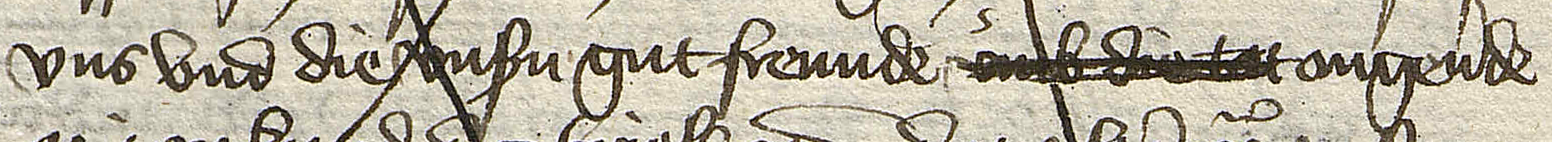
vns vnd die vnſ*n gut freunde v̈mb die tat ongeu*de
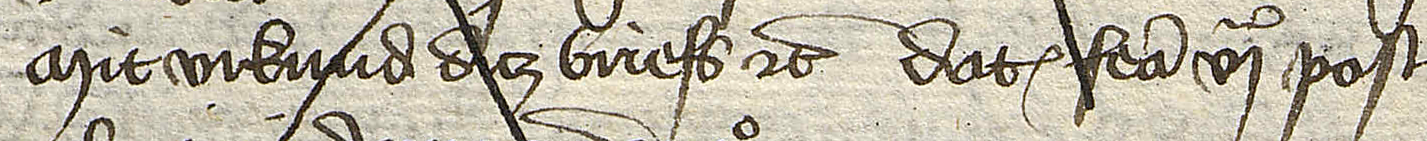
Mit vrkund* dicʒ briefs ec* dat* fea* vi* poſt
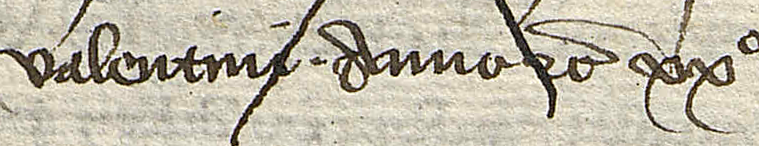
valentini Anno ec* xx*
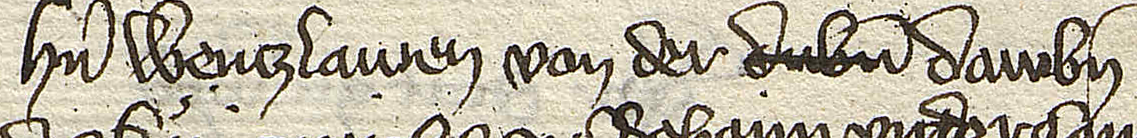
hn* Wencʒlawen von der Dubn* Dawbn*
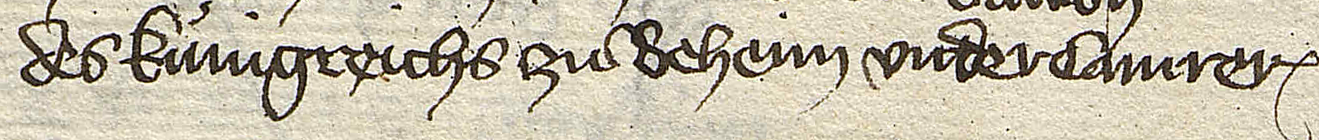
des künigreichs cʒu Beheim vnder Camrer*
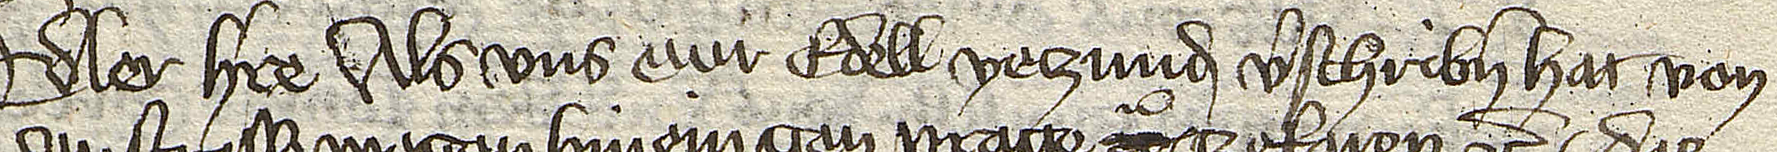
Edler h*re Als vnd ewr Edell yecʒund* v*ſchribn* hat von
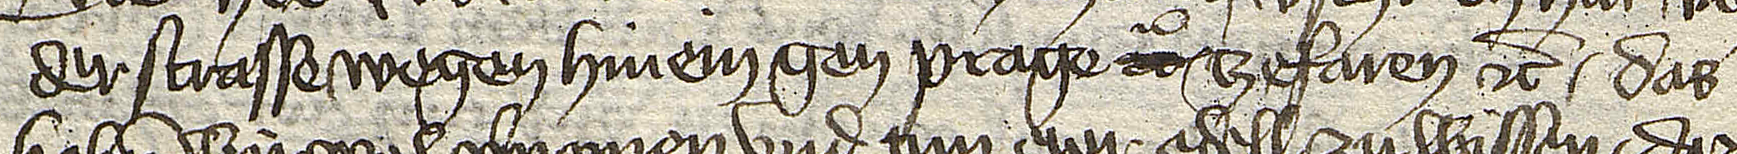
der ſtraſſe wegen hinein gen prage ec* cʒefaren ec* / das
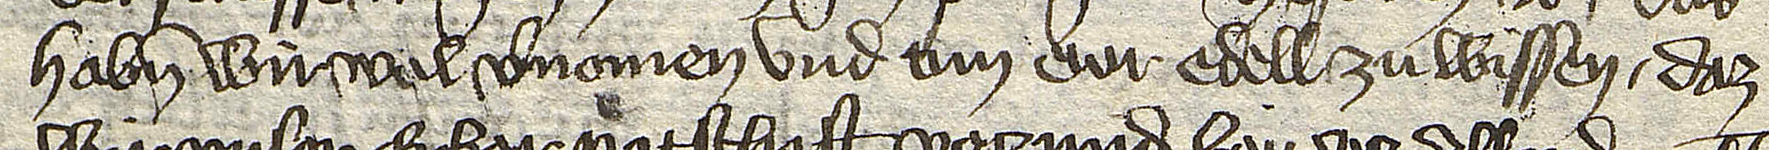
habn* wir wol v*nomen vnd tun ewr edell cʒu wiſſen / daʒ
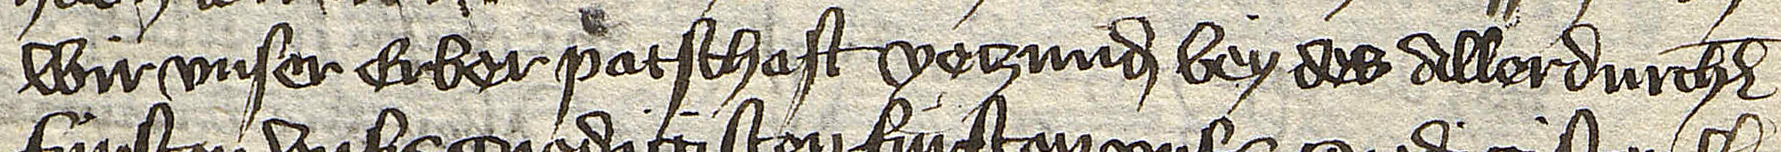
wir vnſer Erber potſchaft yecʒund* bey des Allerdurchl*
